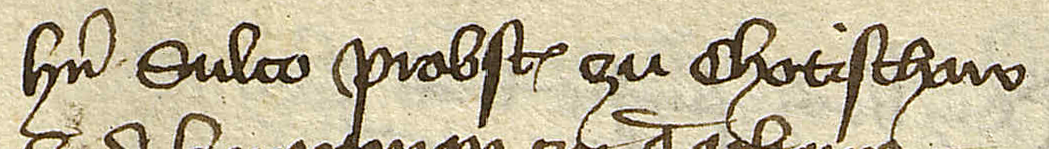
hn* Sulco Probſt* cʒu Chotiſchaw
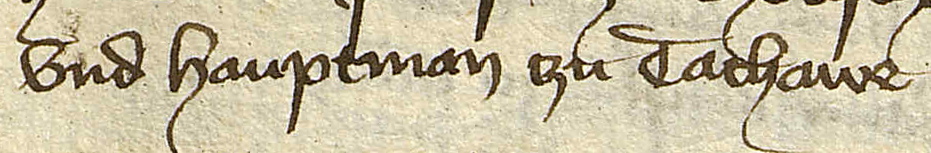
vnd hauptman cʒu Tachawe
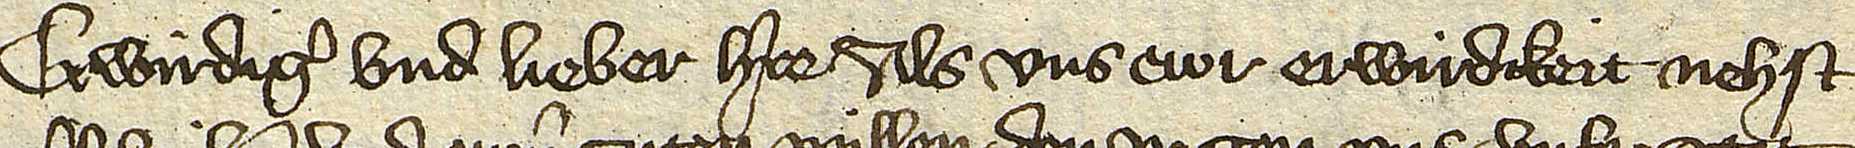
Erwirdig* vnd lieber h*re / Als vns ewr erwirdikeit nehſt
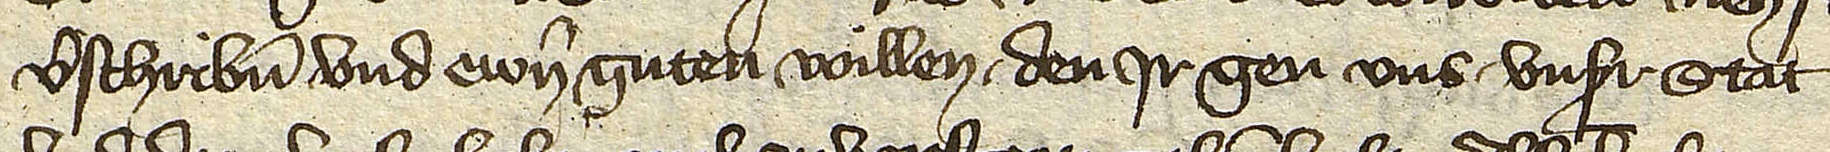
v*ſchribn* / vnd ewn* guten willen / den Ir gen vns / vnſ*r Stat
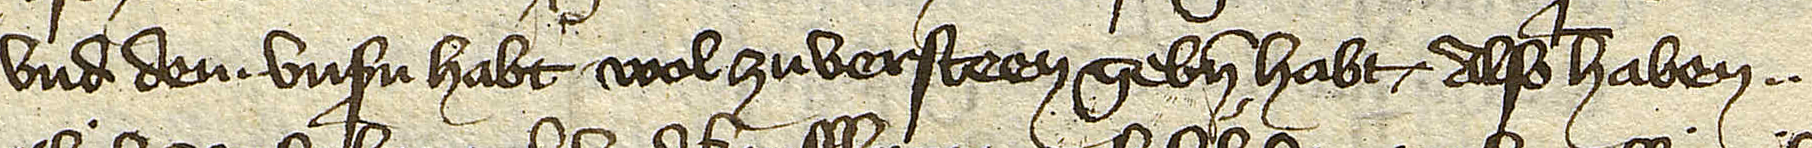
vnd den ~ vnſ*n wol cʒu verſteen gebn* habt / Alſo haben ~
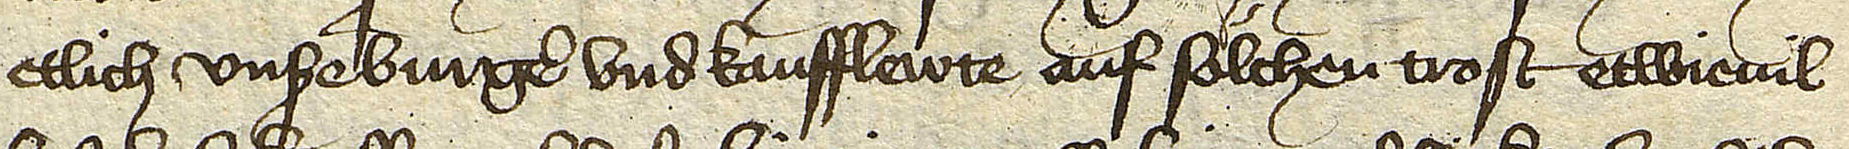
etlich vnſ*e burge* vnd kaufflewte auf ſolchen troſt etwieuil
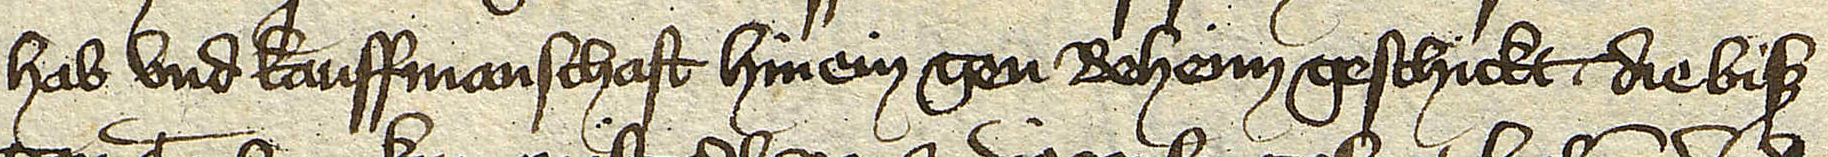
hab vnd kauffmanſchaft hinein gen Beheim geſchickt / die biſʒ
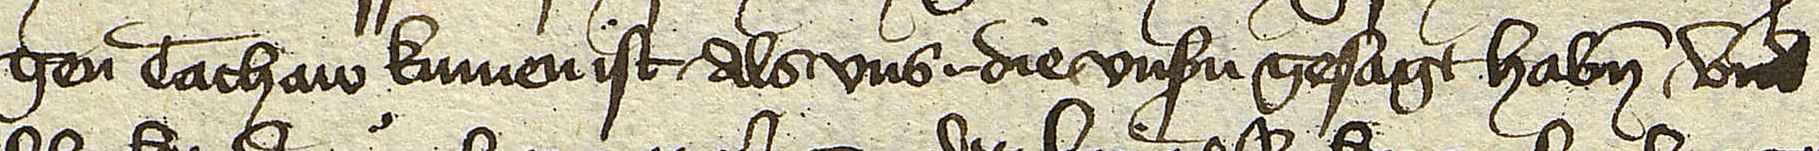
gen Tachaw kumen iſt / Als vns ~ die vnſ*n geſagt habn* / vnd
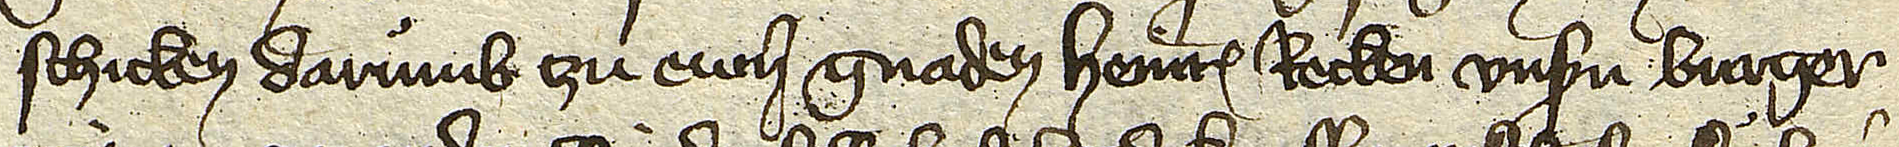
ſchicken darümb cʒu ewn* gnaden heinr* Recken vnſ*n burger
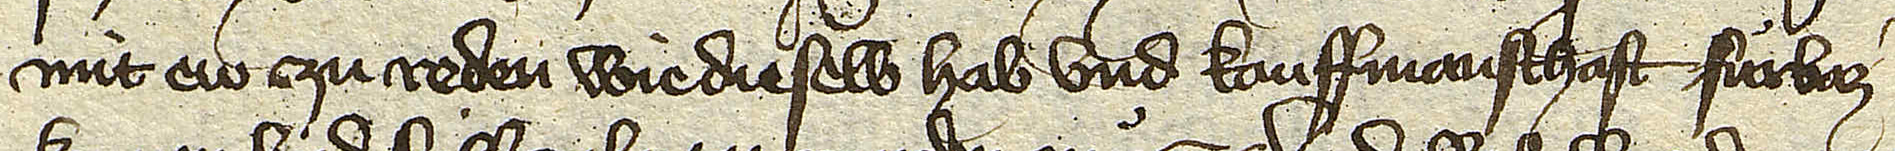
mit ew cʒu reden wie dieſelb hab vnd kauffmanſchaft fürbaʒ
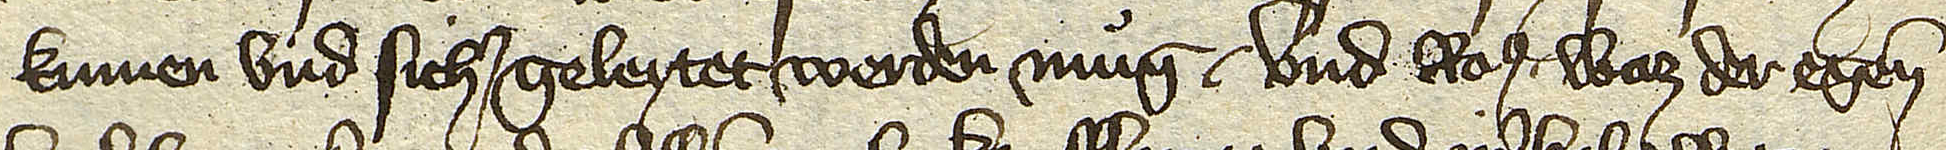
kumen vnd ſich* geleytet werden müg / vnd Ro* / waʒ der egen*
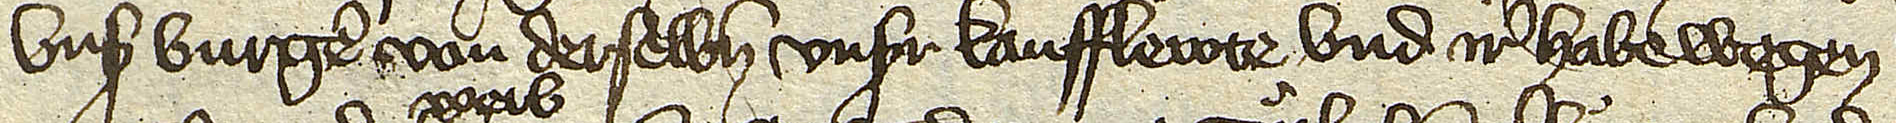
vnſ* burge* von derſelbn* vnſ*r kaufflewte vnd ir* habe wegen
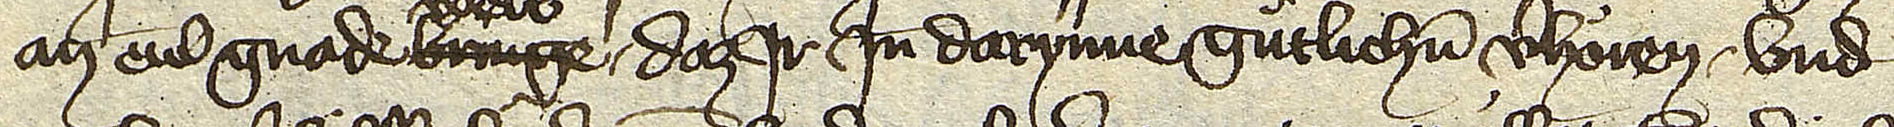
an ew* gnade bringe / daʒ Ir In darynne gütlichn* v*hören / vnd
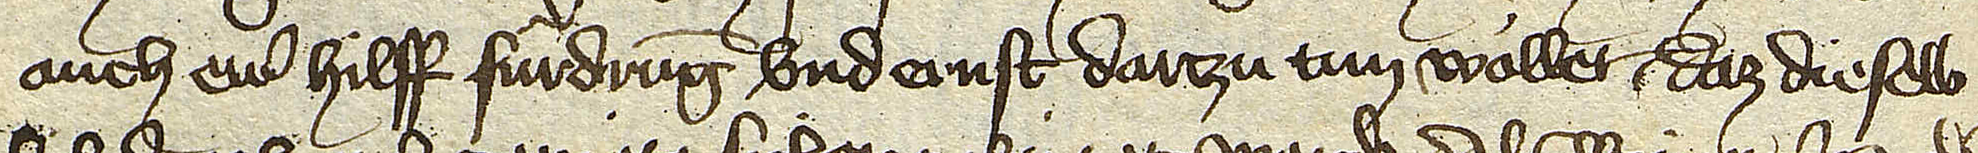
auch ew* hilff fürdrug* vnd ernſt darcʒu tun wöllet / daʒ dieſelb
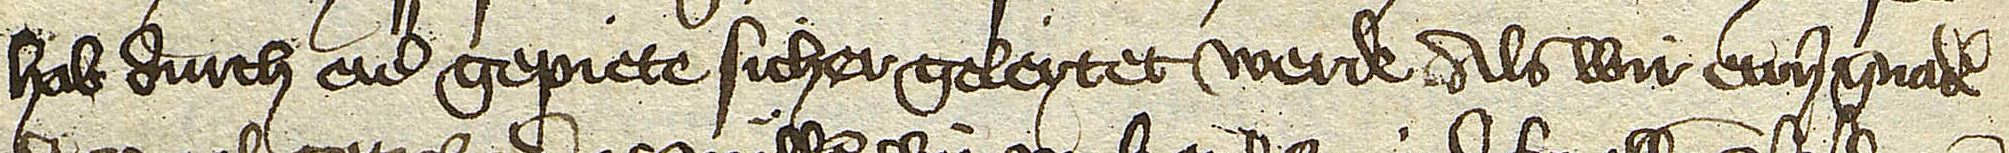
hab durch ew* gepiete ſicher geleytet werde Als wir ewn* gnade*
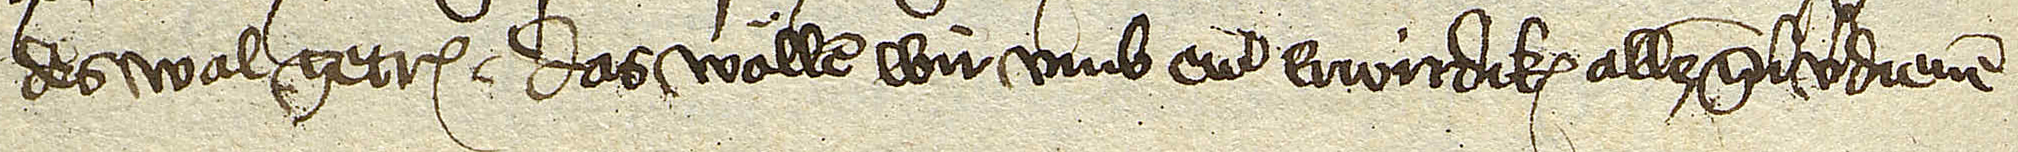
des wol getr* / das wölle* wir vmb ew* Erwirdik*allcʒ* gn* v*diene*
